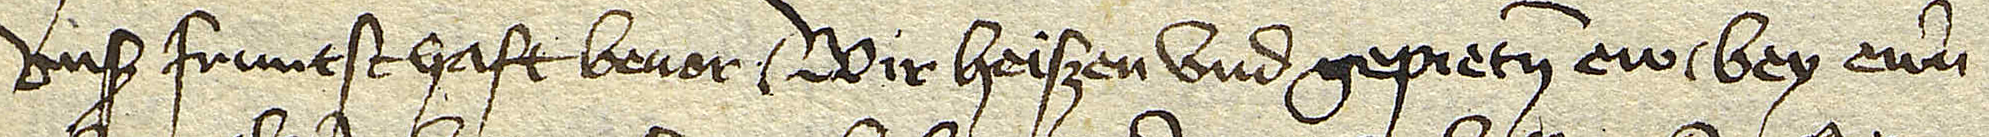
Vnſ* fruntſchaft beuor / Wir heiſʒen vnd gepietn* ew / bey ewn*
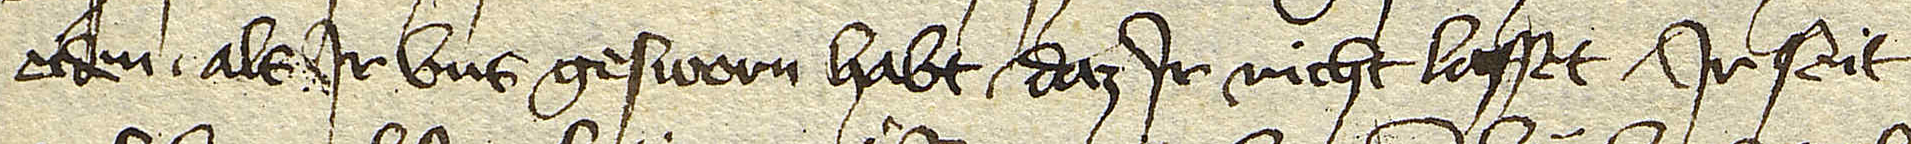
eiden / als Ir vns geſworn habt / daʒ Ir nicht laſſet / Ir ſeit
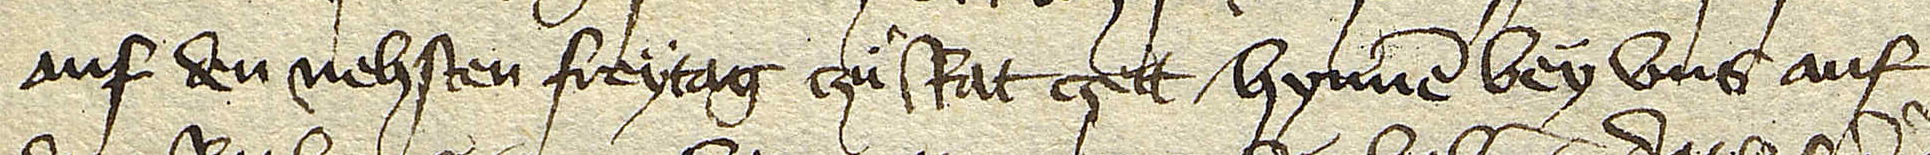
auf den nehſten freytag cʒü Rat cʒeit / hynne* bey vns auf
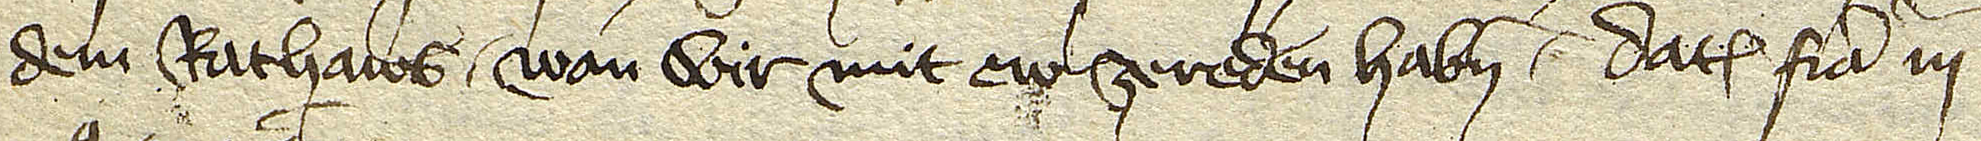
dem Rathaws / wan wir mit ew cʒereden habn* / dat* fia* iii*
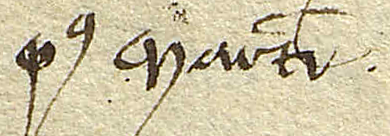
p* Marti* .
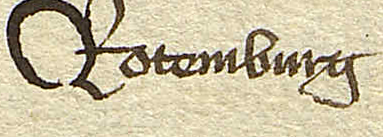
Rotemburg
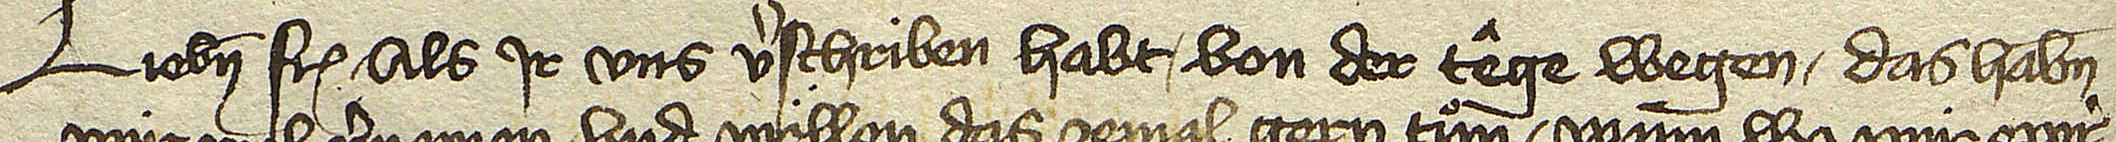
Liebn* fr* / Als Ir vns v*ſchriben habt / von der tëge wegen / das habn*
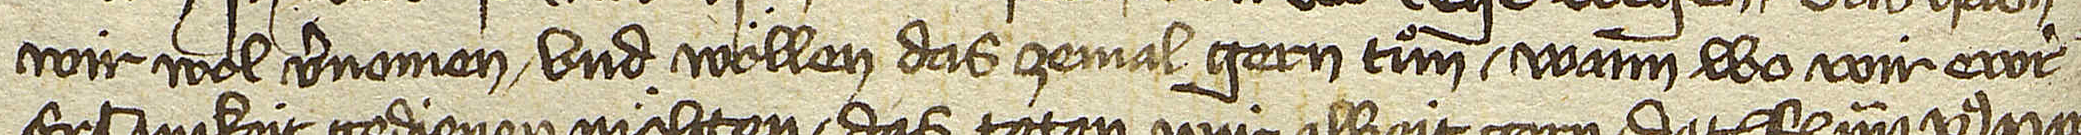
wir wol v*nomen / vnd wöllen das cʒemal gern tün / wann wo wir ewr*
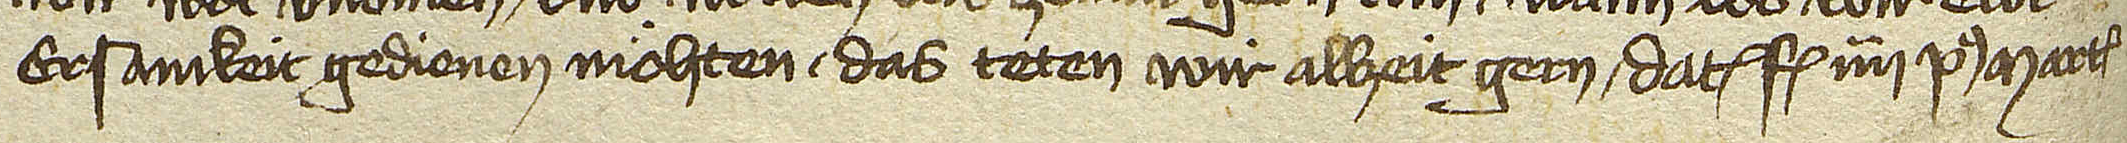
Erſamkeit gedienen möhten / das teten wir allʒeit gern / dat* f* iiii* p* Mart*
